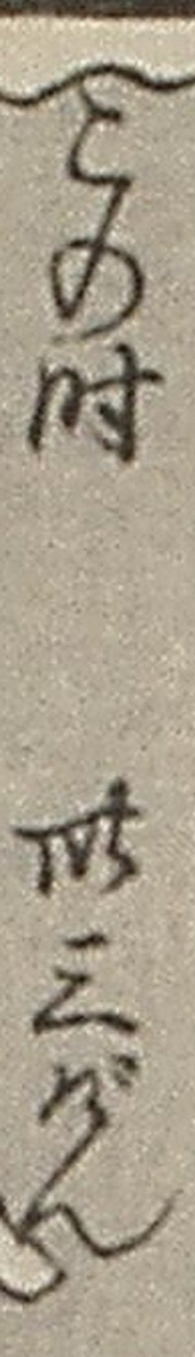この時卅三げん
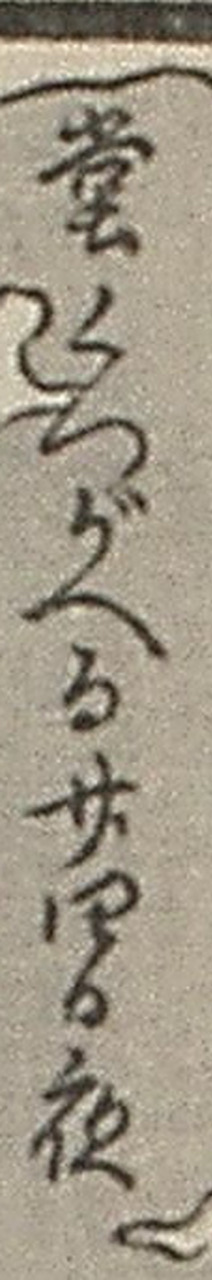堂くつがへる廿四日夜
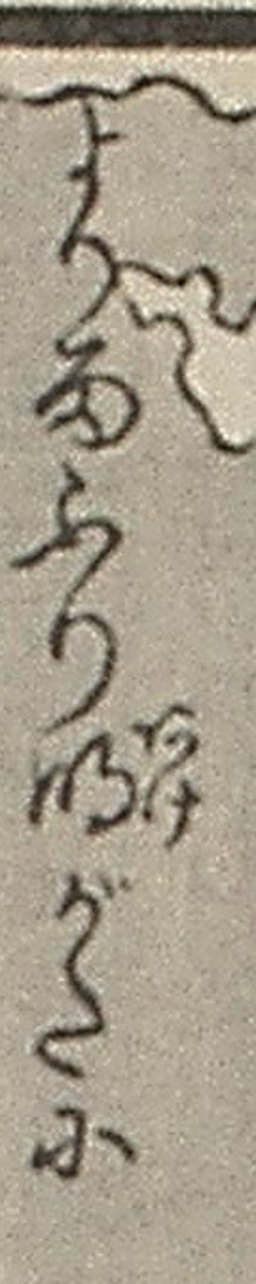より雨ふり明がたに
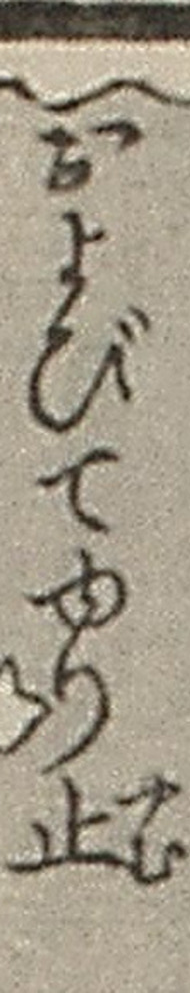およびてゆり止
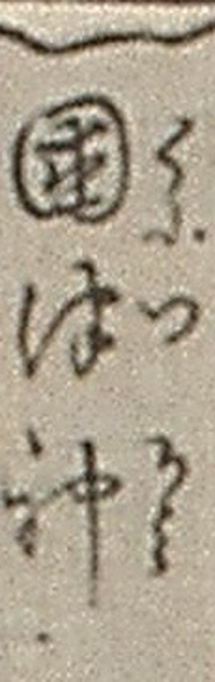国津神
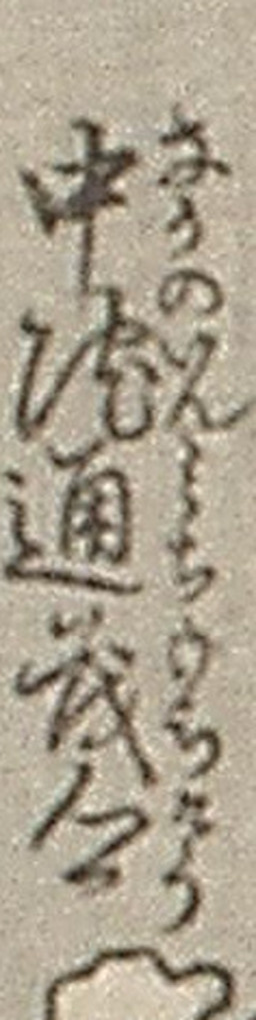中院通茂卿

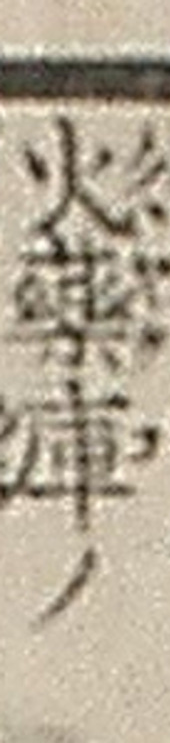火薬庫ノ
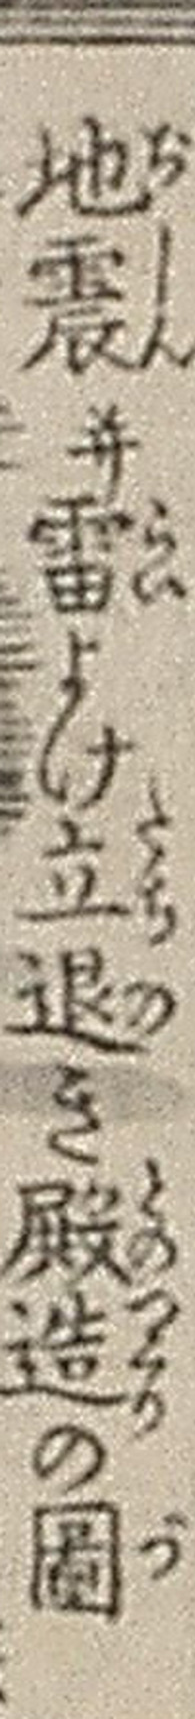地震并雷よけ立退き殿造の図
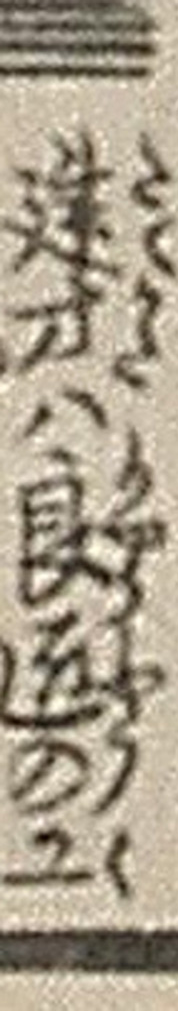建方は良匠の工
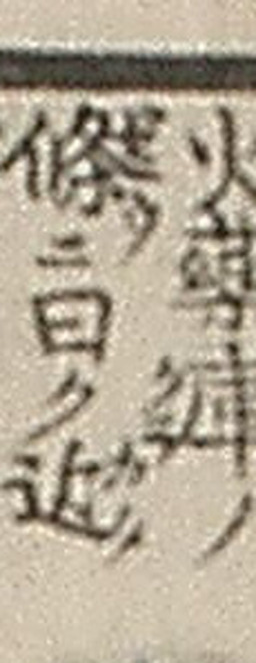条ニ曰ク近
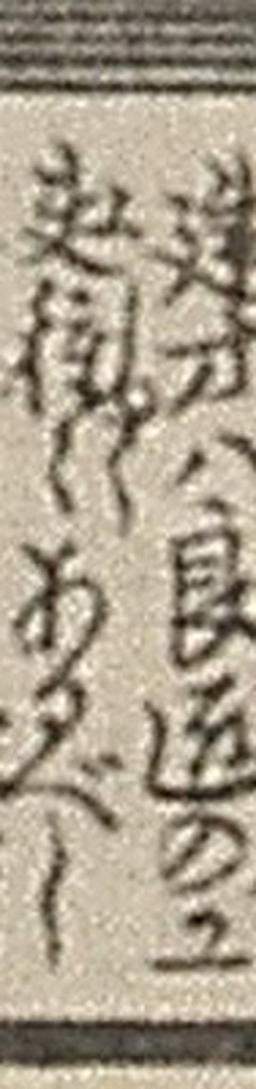夫種々あるべし
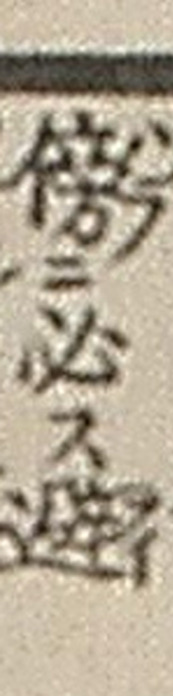傍ニ必ス避
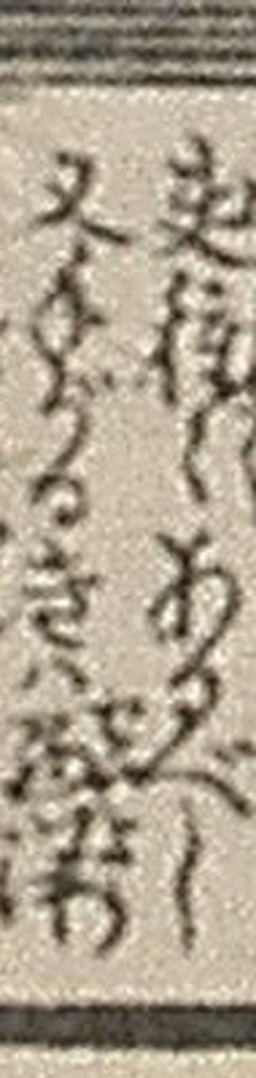又手がるきは西洋
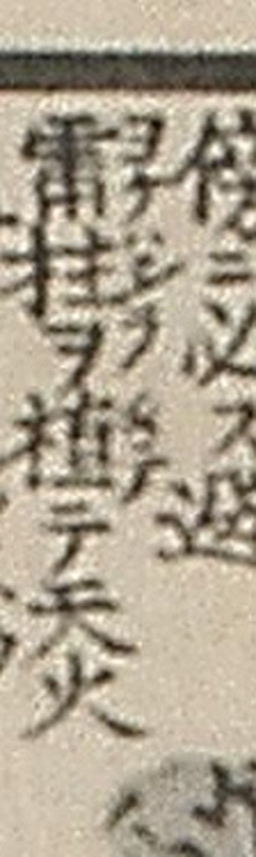雷柱ヲ植テ天火
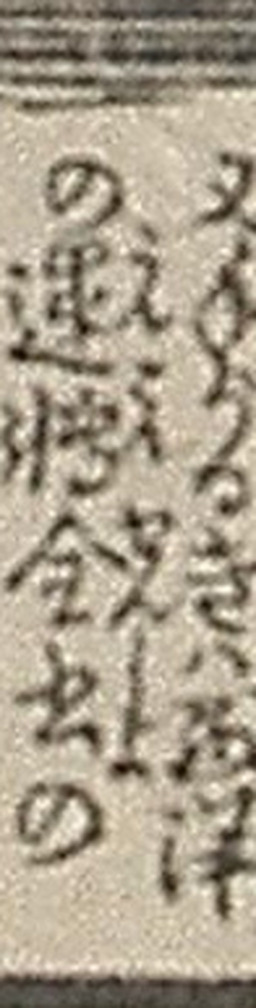の運転全書の
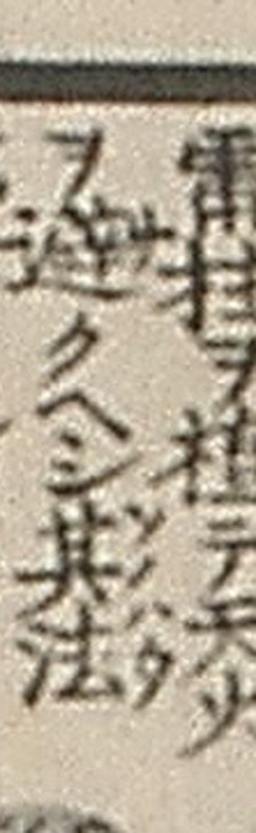ヲ避クヘシ其法
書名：大地震暦年考　全
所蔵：東京大学地震研究所図書室 Earthquake Research Institute Library, The University of Tokyo, JAPAN
